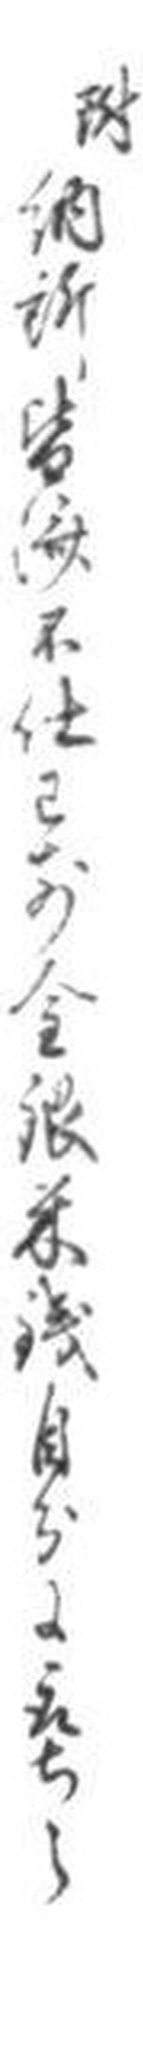納所皆済不仕己前金銀米選銭自分に取ちら
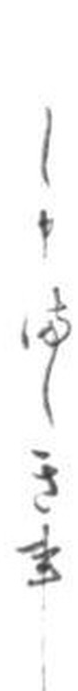し申ましき事
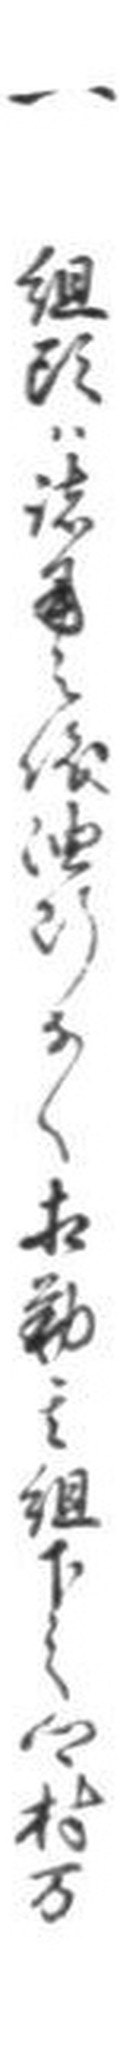一組頭ハ諸用之儀油断なく相勤者其組下之郷村万
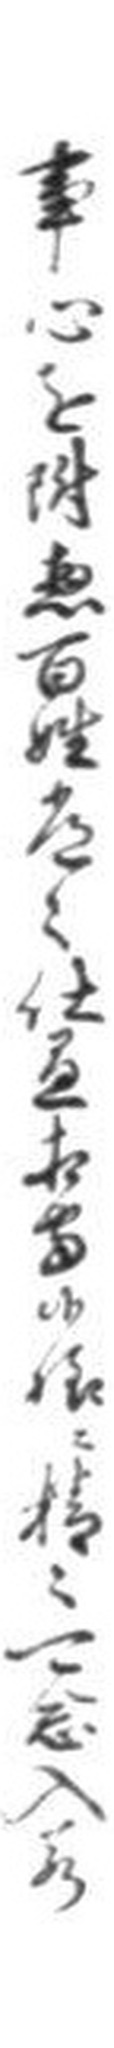事心を附惣百姓道々仕置相守候様ニ精々可念入若
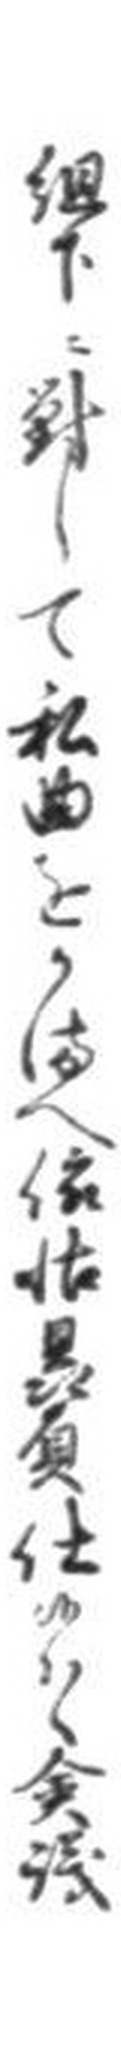組下ニ対して私曲をかまへ依怙贔屓仕候ハヽ僉議
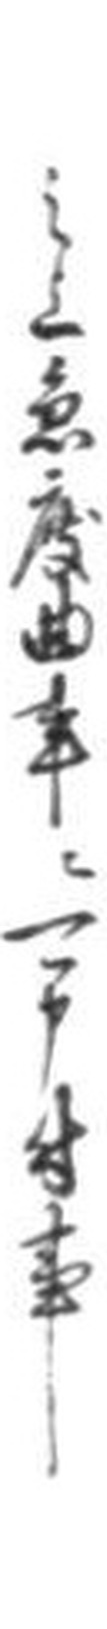之上急度曲事ニ可申付事
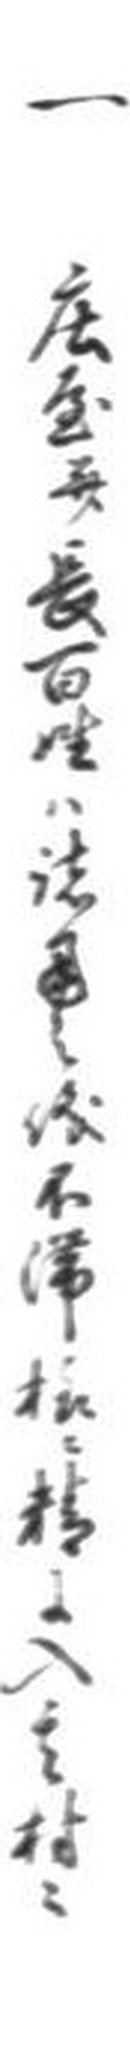一庄屋幷長百姓ハ諸用之儀不滞様ニ精に入其村々
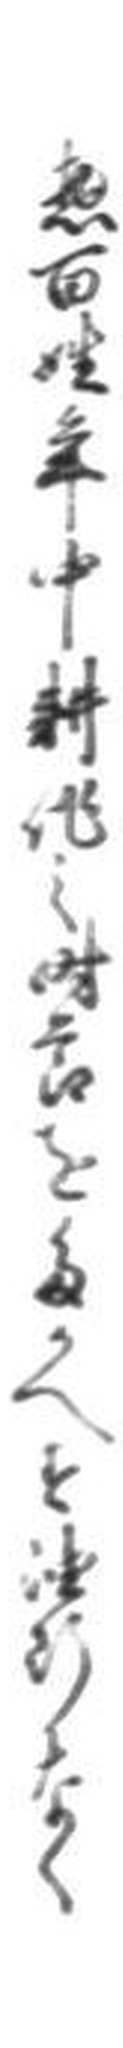惣百姓年中耕作之時節をたかへす油断なく
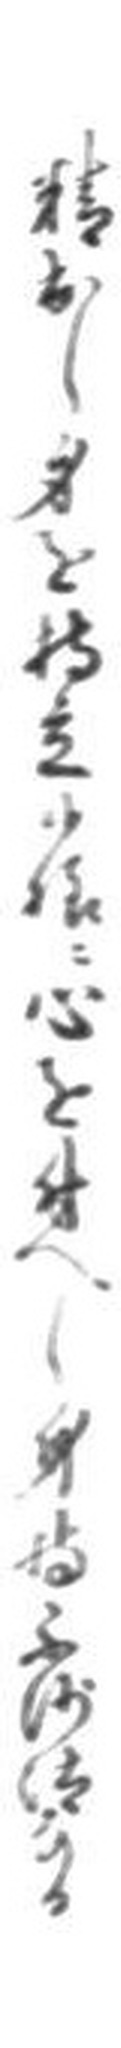精出し身を持立候様ニ心を付へし身持無沙汰なる
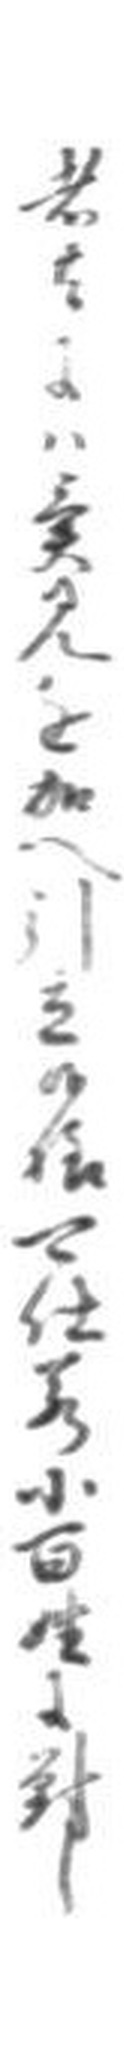者共にハ意見を加へ引立候様可仕若小百姓に対し
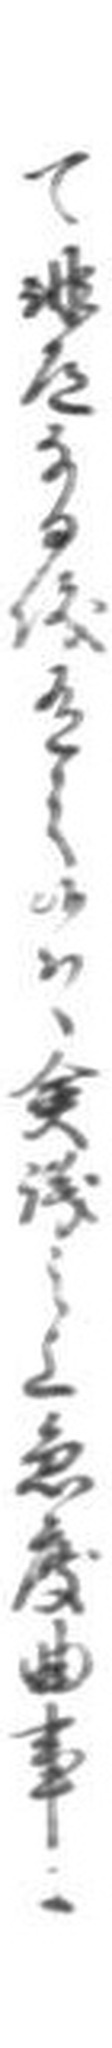て非道なる儀有之候ハヽ僉議之上急度曲事ニ
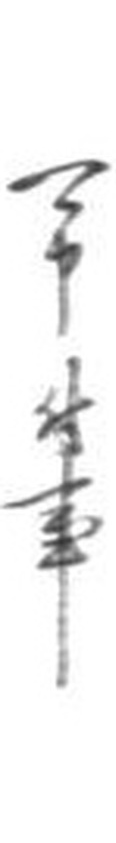可申付事
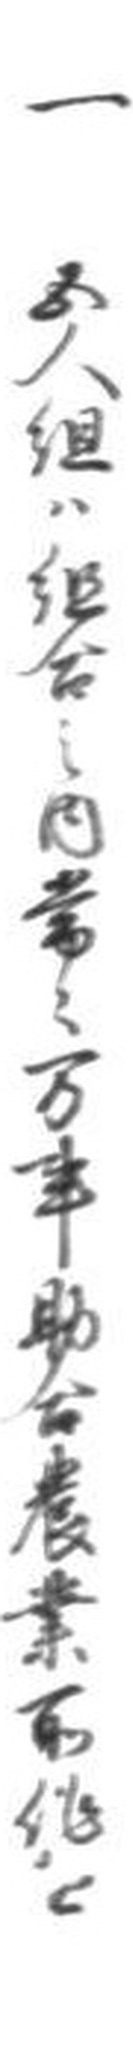一五人組ハ組合之内常々万事助合農業所作を
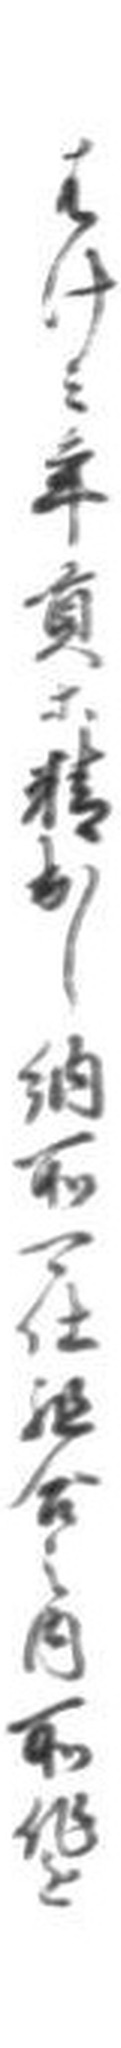はけみ年貢等精出し納所可仕組合之内所作を
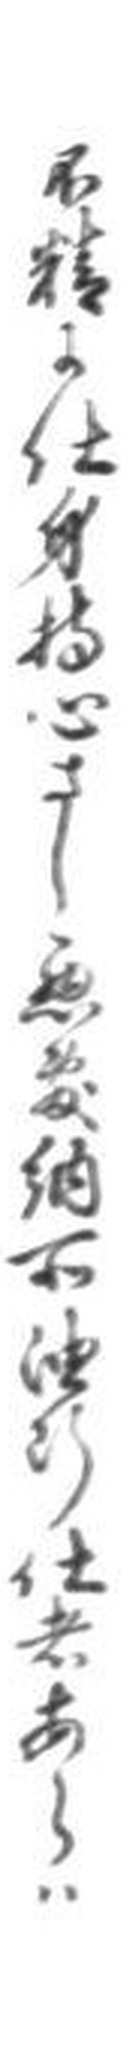不精に仕身持心さし悪敷納所油断仕者あらハ

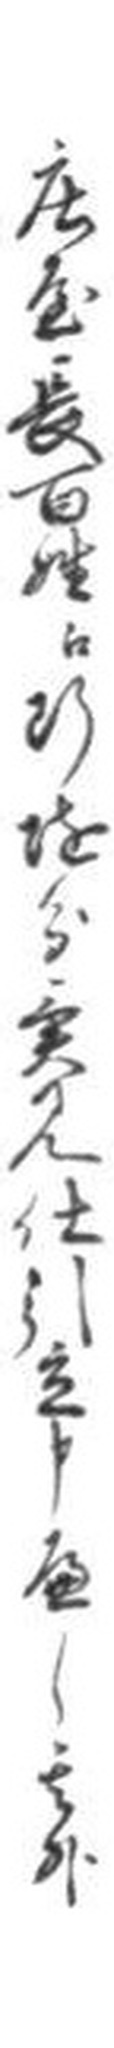庄屋長百姓江断随分意見仕引立申へし其外
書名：家譜 三十四 吉邦公 従享保五年到同六年
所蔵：福井県文書館 Fukui Prefectural Archives
